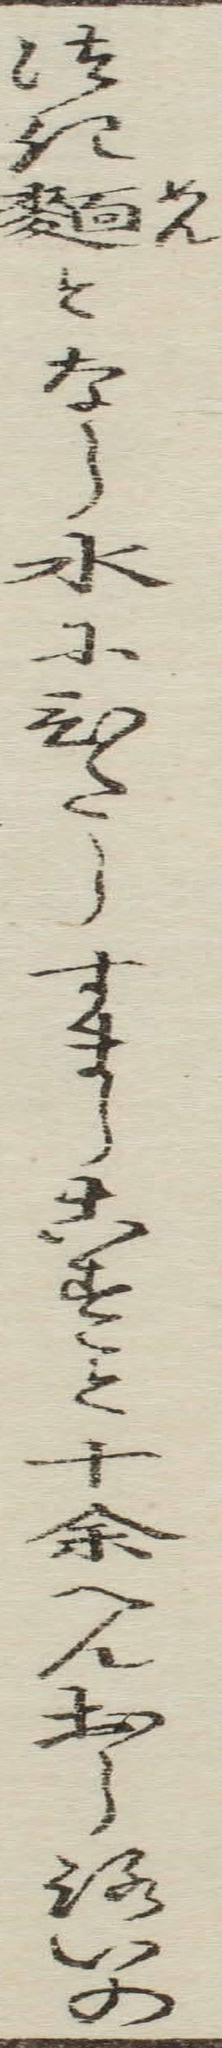つき麺となし水にひたしすましこすこと十余へんおしろいの
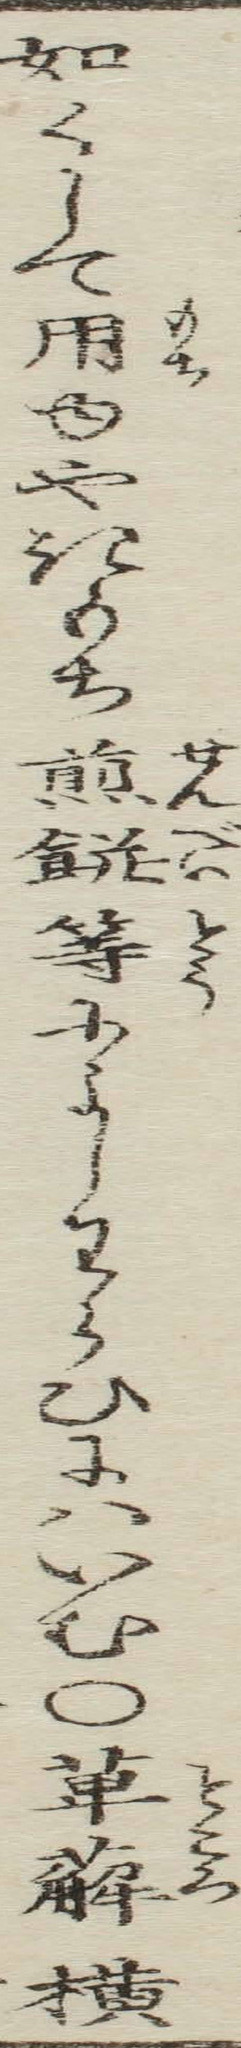如くして用ゆやきもち煎餅等によしわらひにはいむ○萆薢横
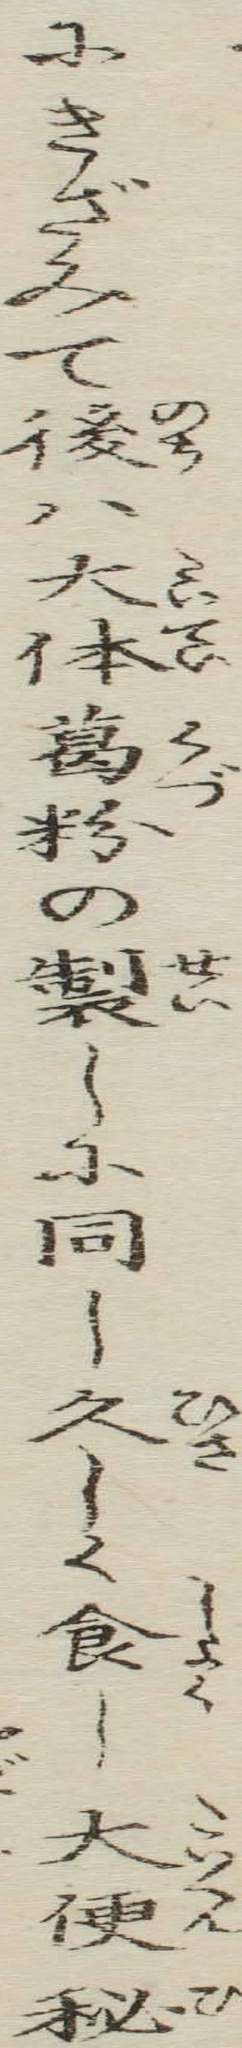にきざみて後は大体葛粉の製しに同し久しく食し大便秘
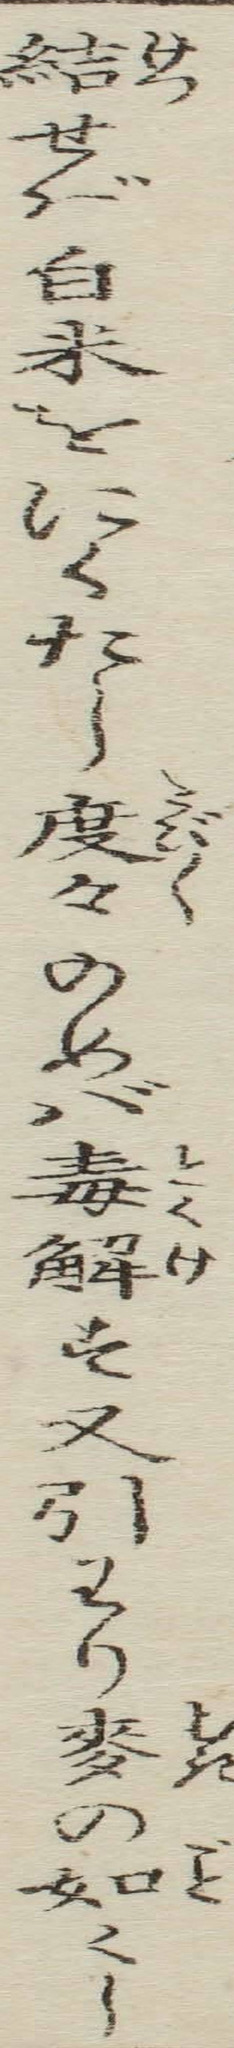結せば白米をにくたし度々のめば毒解す又引わり麦の如くし

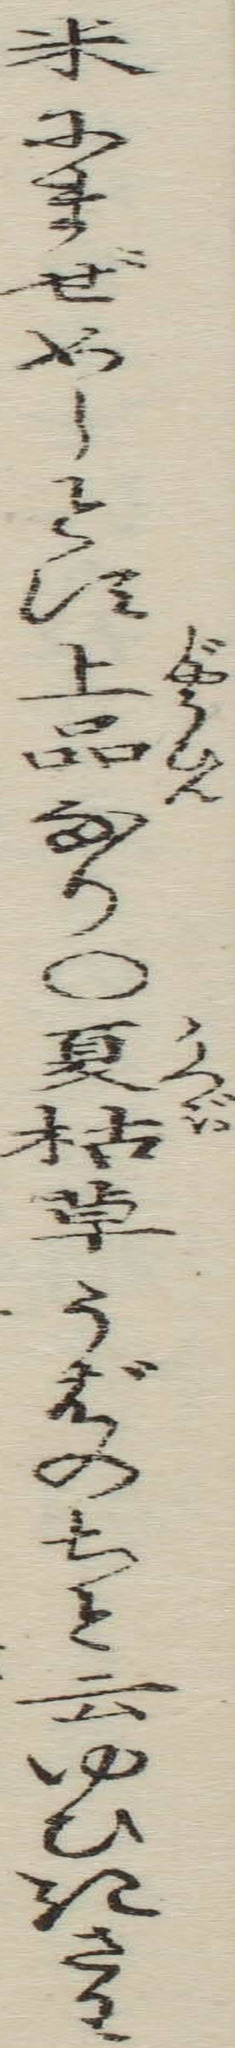米にまぜめしとす上品なり○夏枯草うばのちと云ゆひきさわ
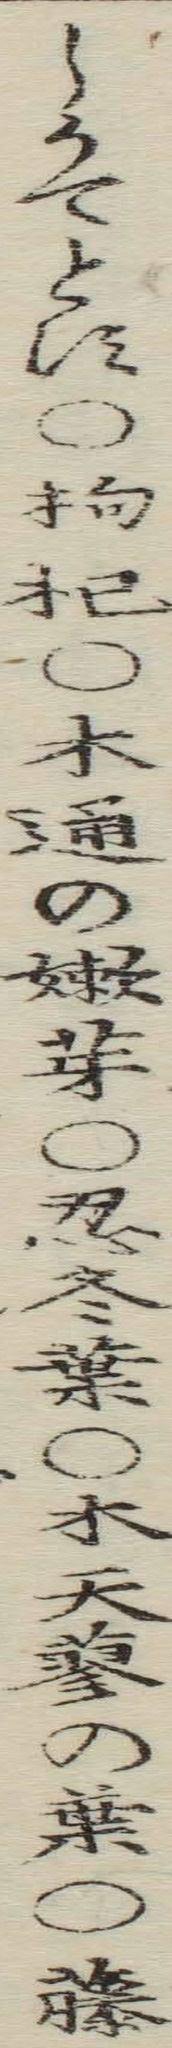しかてとす○枸杞○木通の嫩芽○忍冬葉○木天蓼の葉○藤
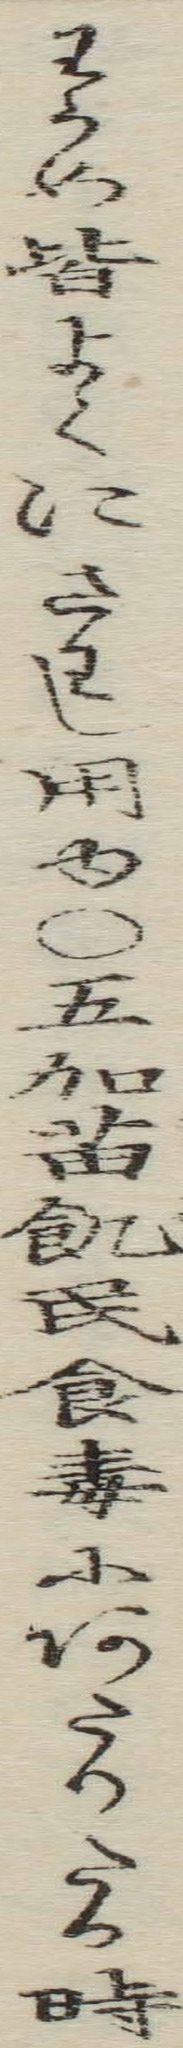わかめ皆よくにさわし用ゆ○五加苗飢民食毒にあたりたる時
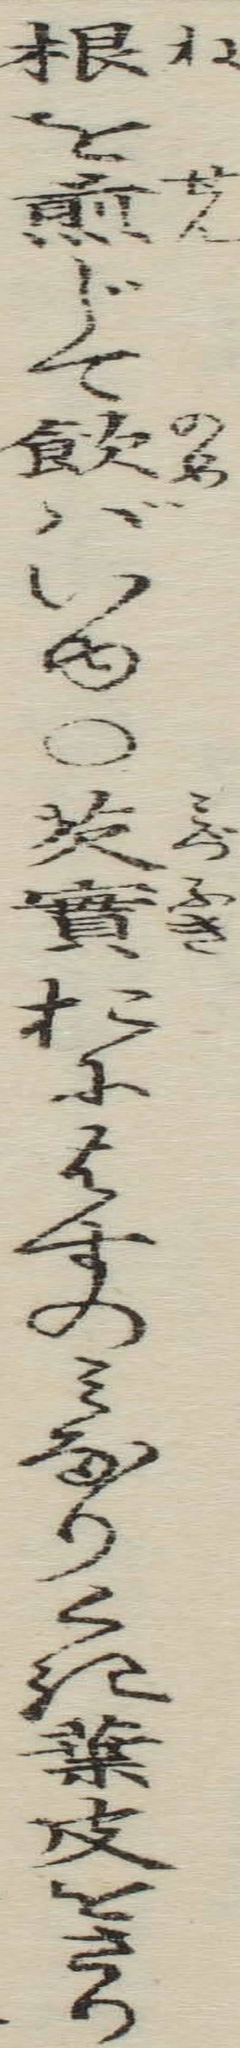根を煎じて飲ばいゆ○芡實おにはすのみなりくき葉皮をさり
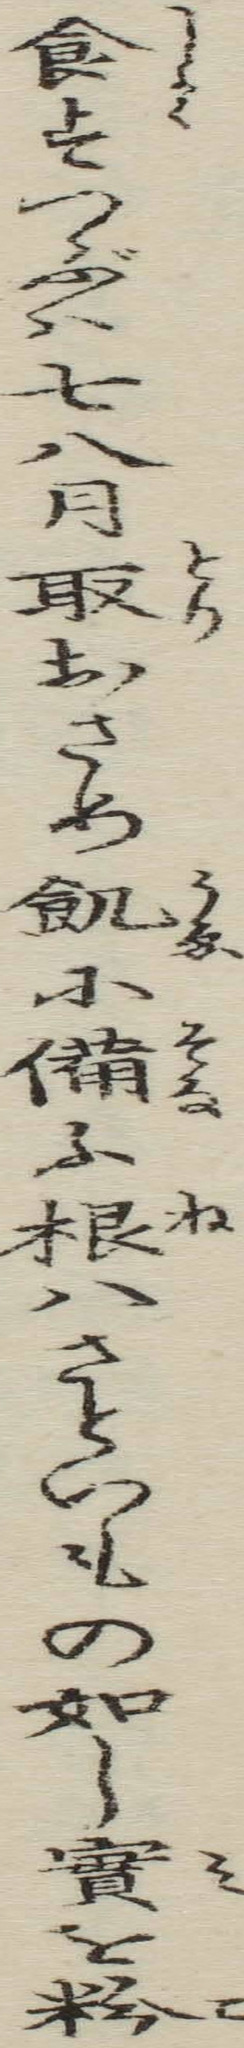食すつぶは七八月取おさめ飢に備ふ根はさといもの如し實を粉
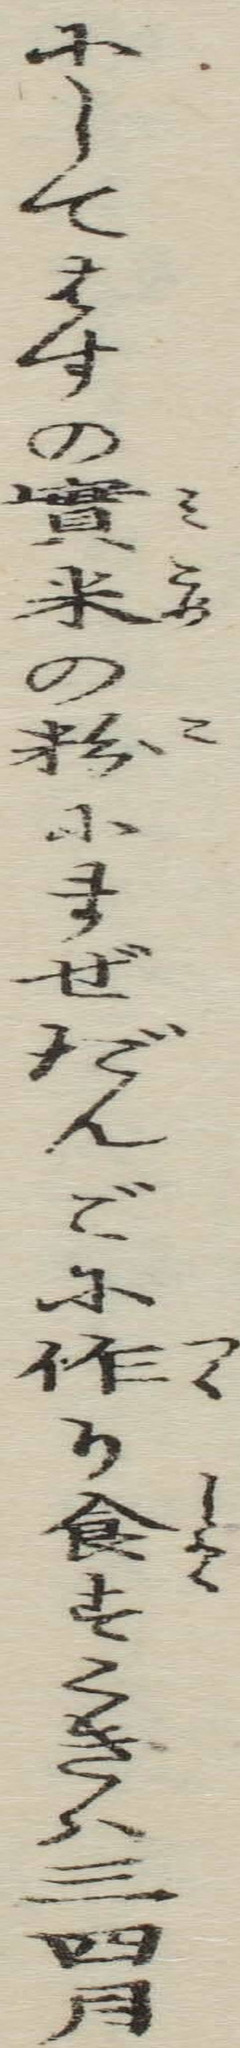にしてはすの實米の粉にまぜだんごに作り食すくきは三四月
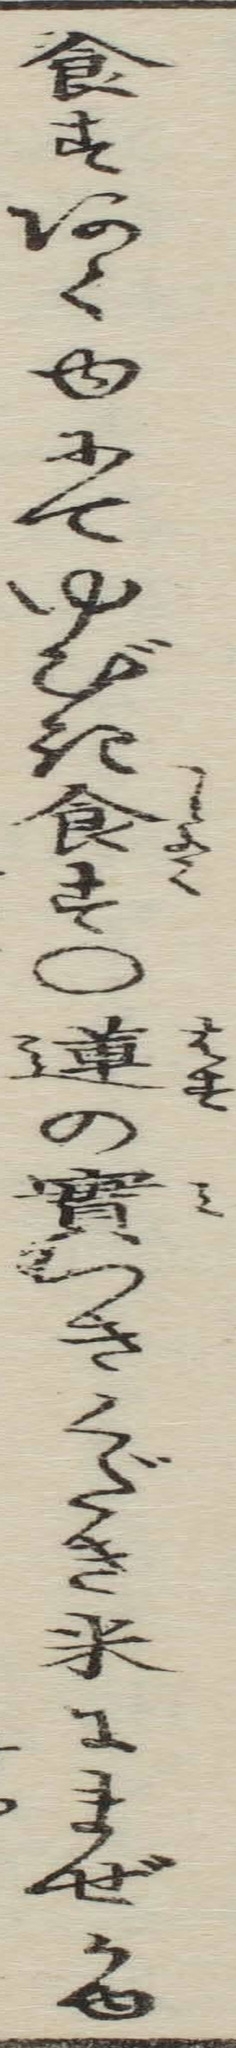食すあくゆにてゆびき食す○蓮の實つきくだき米にまぜかゆ
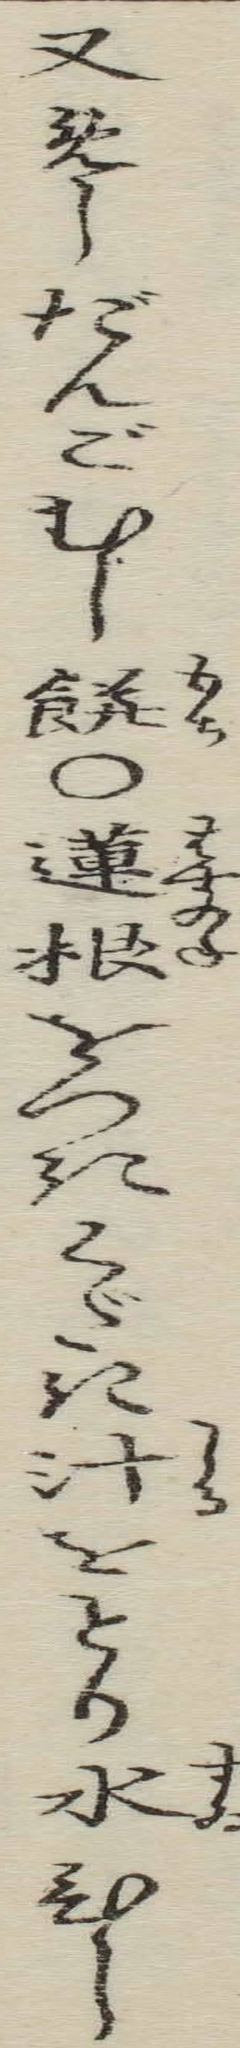又めしだんごむし餅○蓮根をつきくだき汁をとり水ひし
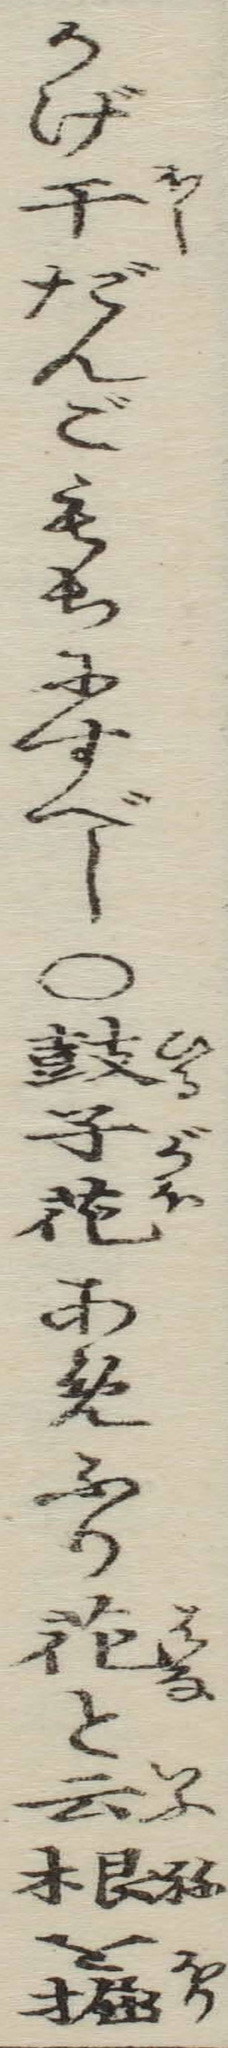かげ干だんごもちにすべし○鼓子花あめふり花と云根を掘
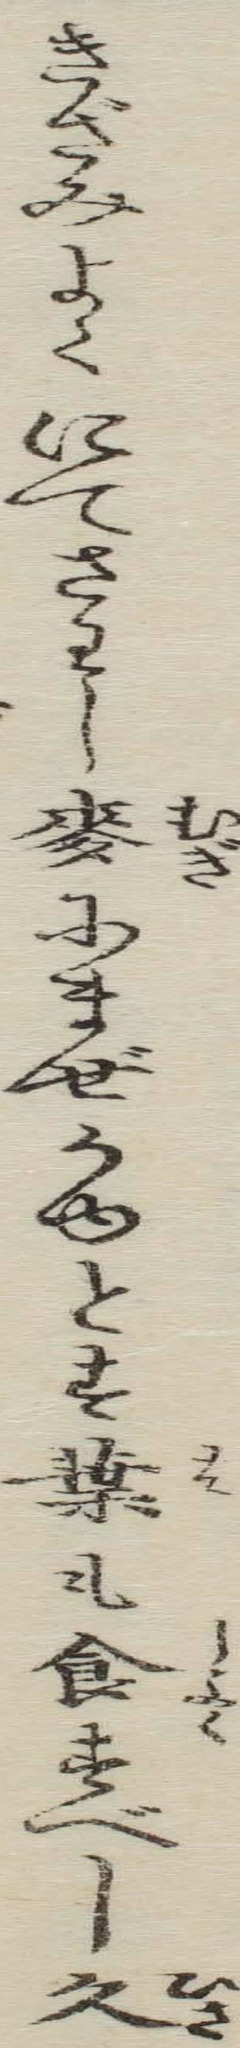きざみよくにてさわし麦にまぜかゆとす葉も食すべし久
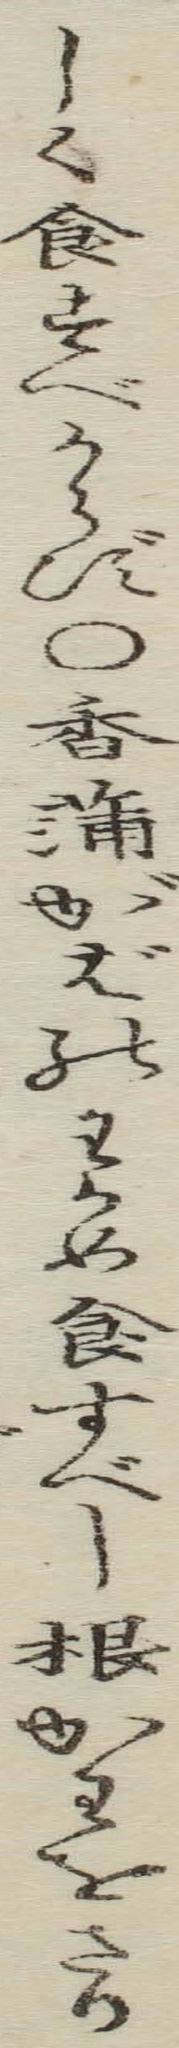しく食すべからず○香蒲がばのわかめ食すべし根かわをさり
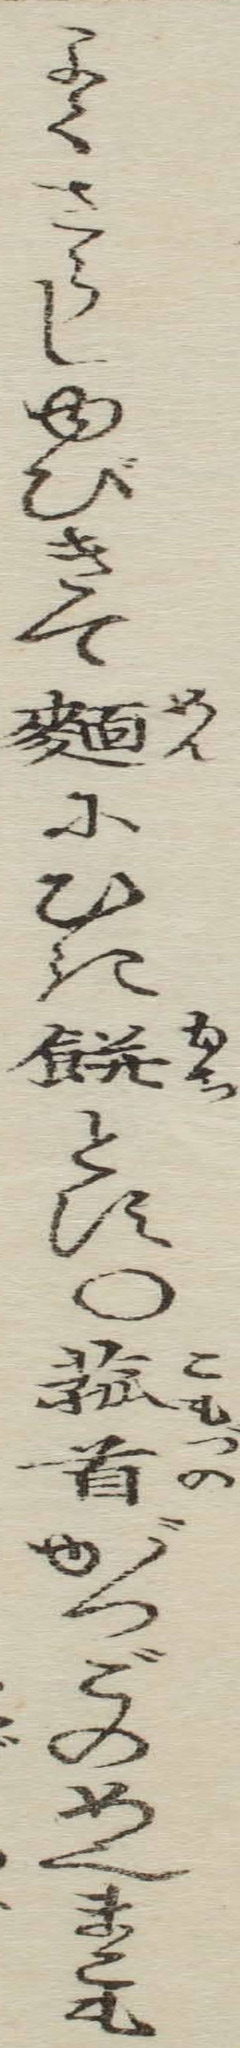よくさらしゆびきて麺にひき餅とす○菰首がつごのめ也まこも
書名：救荒便覧
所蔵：国文学研究資料館
